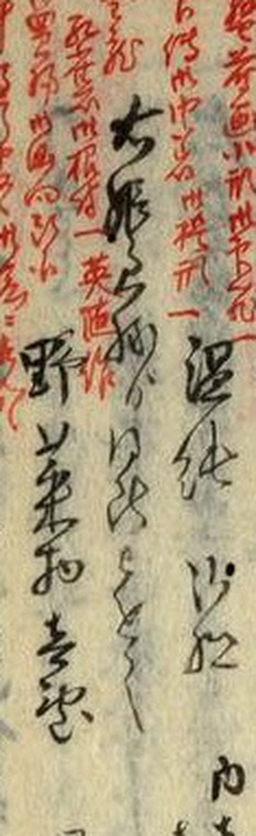右姫君様ゟ同断被進之
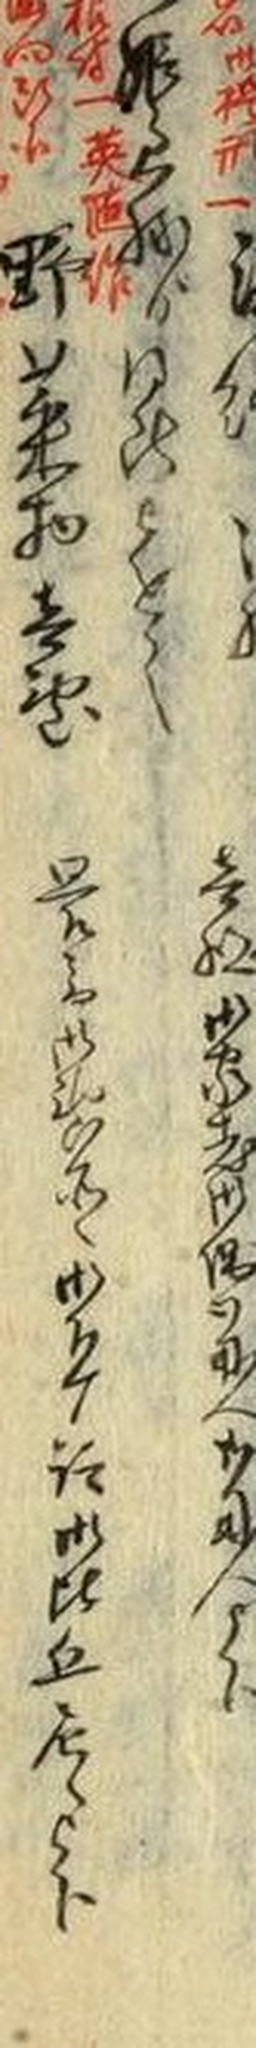野菜物壱台思召ニ而御台所へ御下ケ跡御比丘尼へ被下
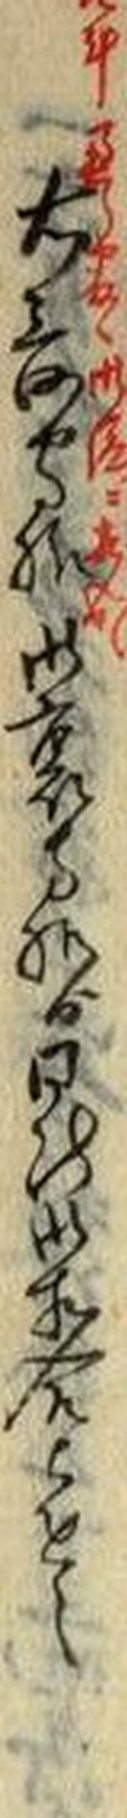右三河守様御裏方様ゟ同断御相合被進之

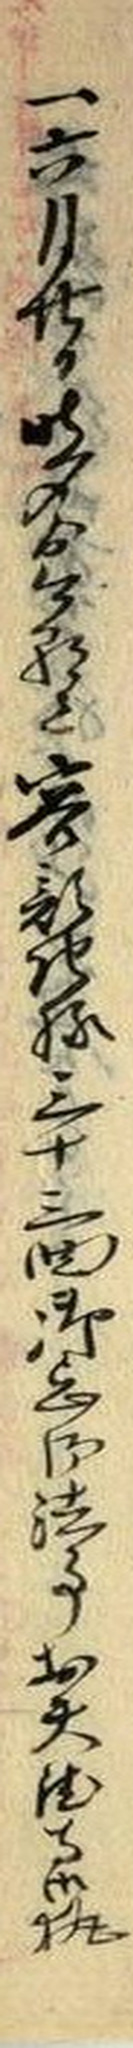一六月廿日昨夕ゟ今朝迄容院様三十三回御忌御法事於天徳寺御執
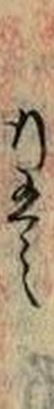行有之
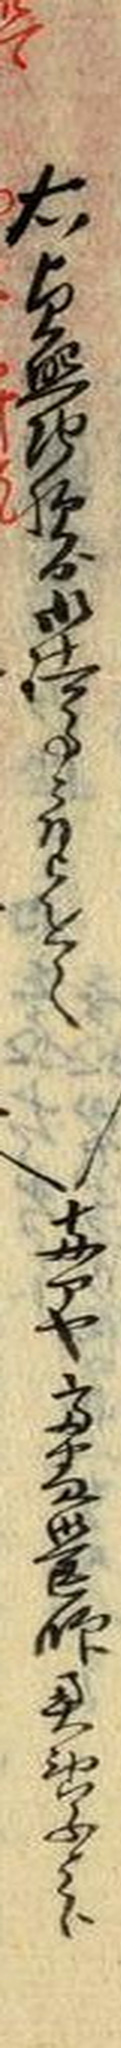右貞照院様ゟ御法事ニ付被進之両部や当番御医師奥台子被下
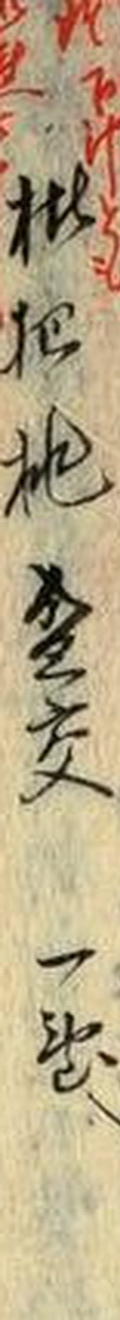枇杷桃盛交一台
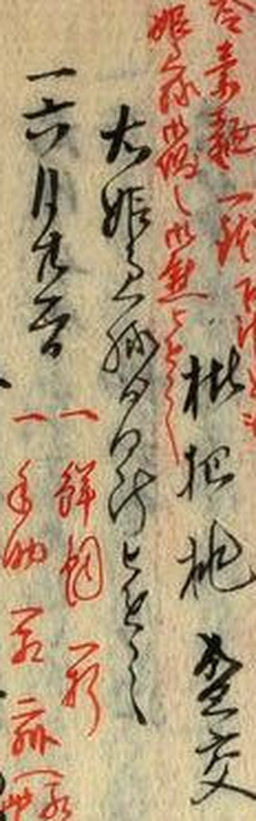右姫君様ゟ同断被進之
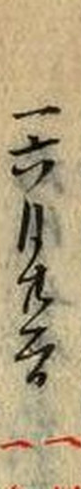一六月廿二日
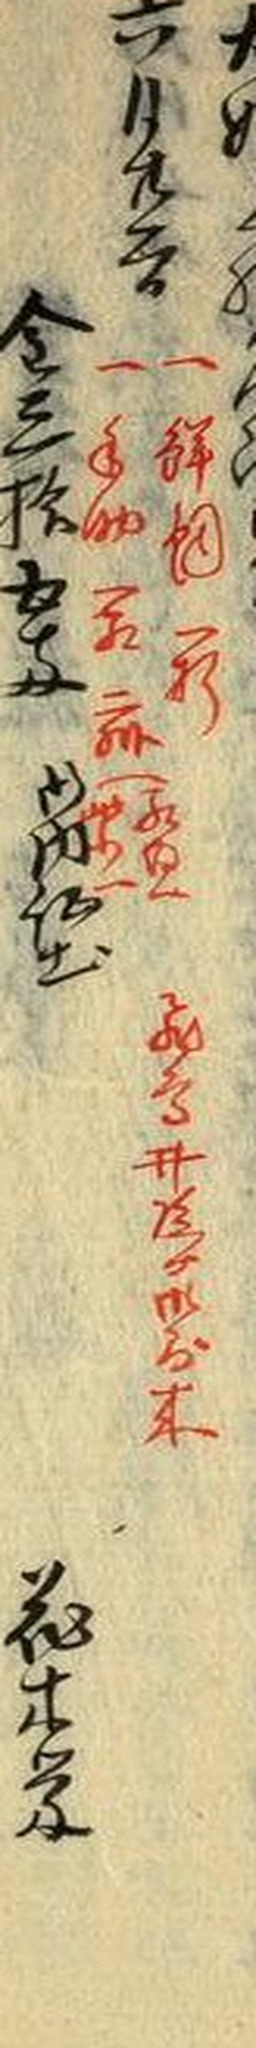金三拾五両御内証出花木栄
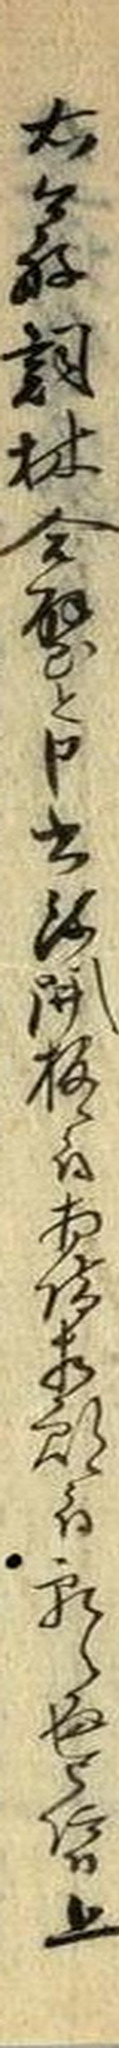右今般詞林合璧と申書致開板候ニ付拝借相願候ニ付願之通被仰付上
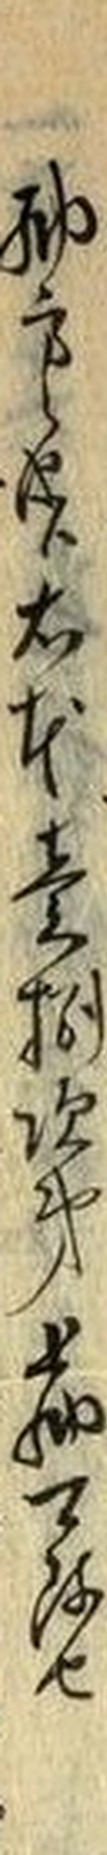納方之儀ハ右本売捌次第上納可致由
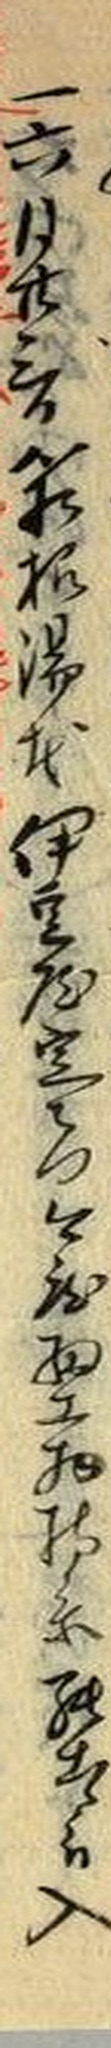一六月廿三日箱根湯本伊豆屋定右衛門今度細工物持参罷出候ニ付入
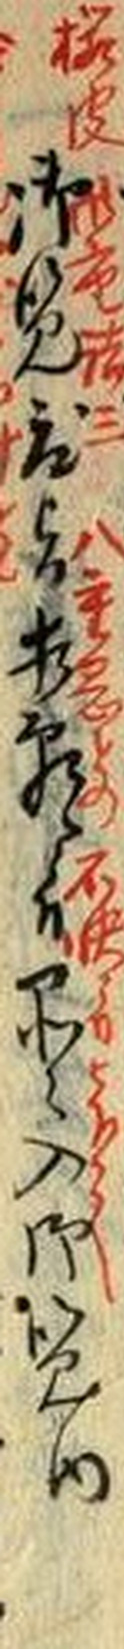御覧度旨相願候ニ付品々入御覧候内
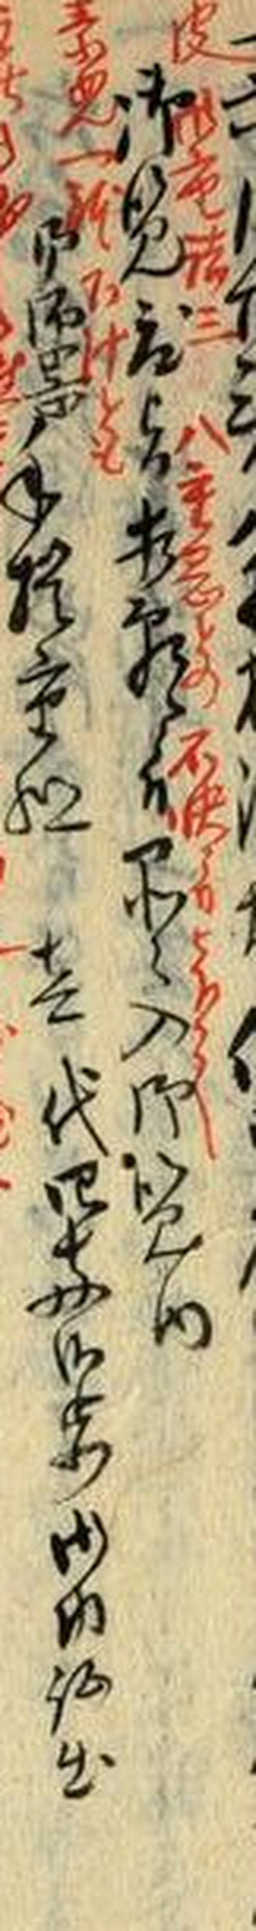御酒器手提重組壱代四両弐歩御内証出
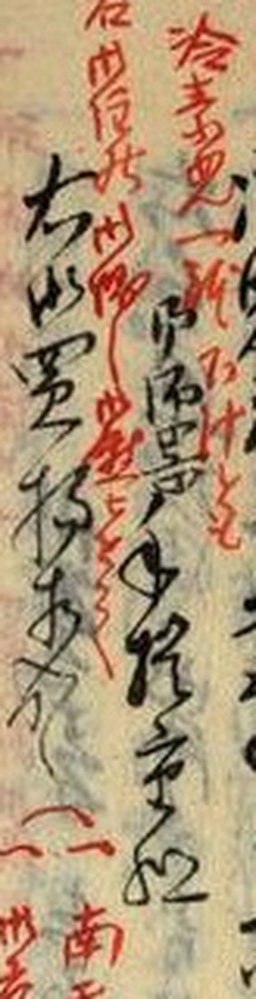右御買揚相成候
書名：少傅日録抄（斉承付側向頭取日記、在府）
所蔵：福井県文書館 Fukui Prefectural Archives
